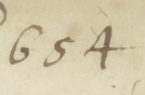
654
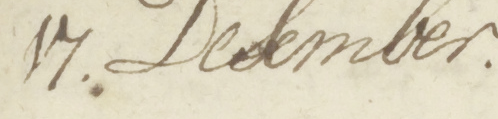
17. Desember.
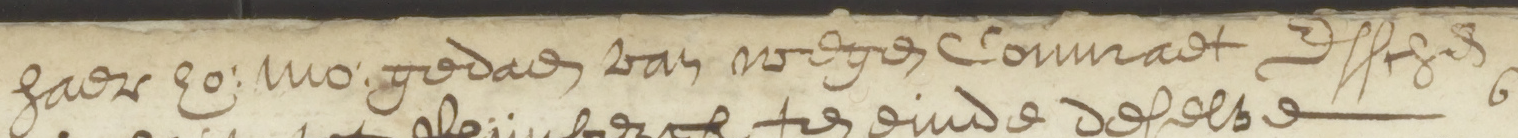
haer ho:mo: gedaen van wegen Connraet Esschen
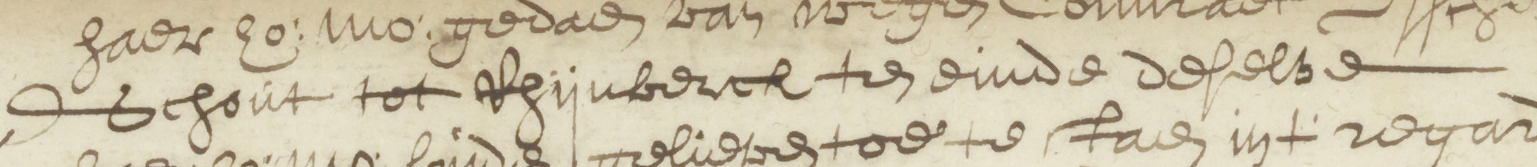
Schout tot Rhijnberck ten einde deselve
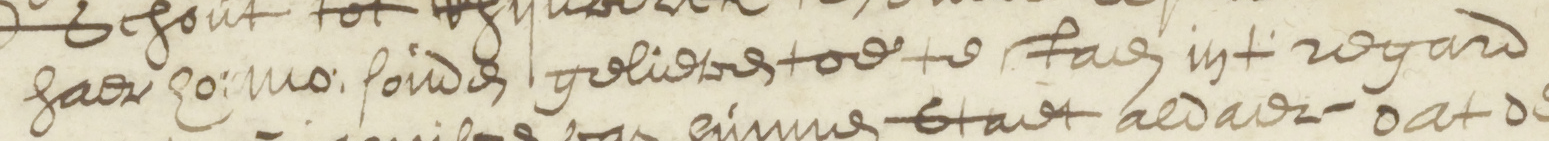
haer ho:mo: souden gelieven toe te staen int' regard
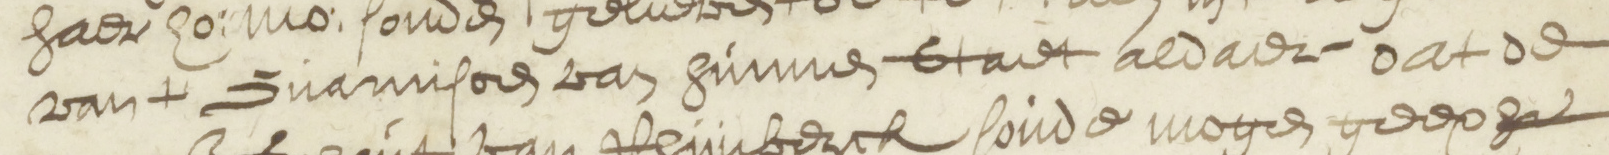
van t‛ Guarnisoen van hunnen Staet aldaer dat de
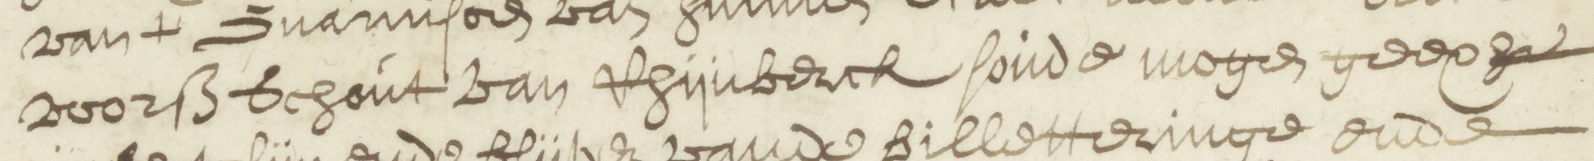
voorsz Schout van Rhijnberck soude mogen geexha
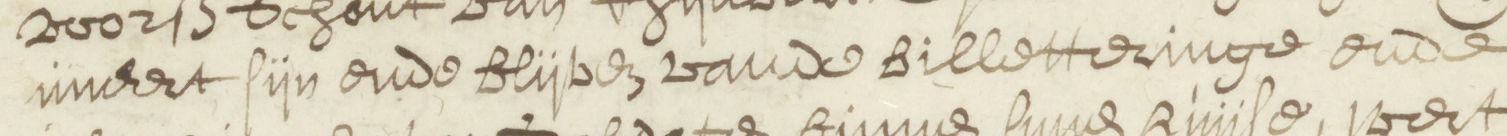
imeert sijn ende blijven vande billetteringe ende
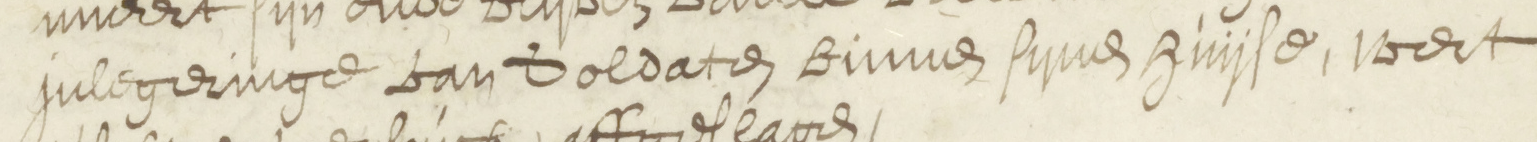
Inlegeringe van Soldaten binnen sijnen huijse, wert
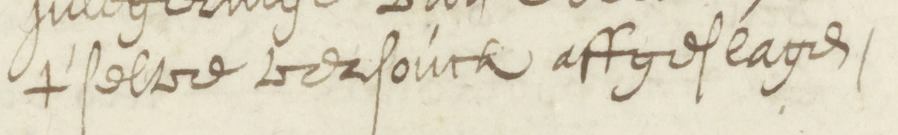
t'selve versouck affgeslagen.
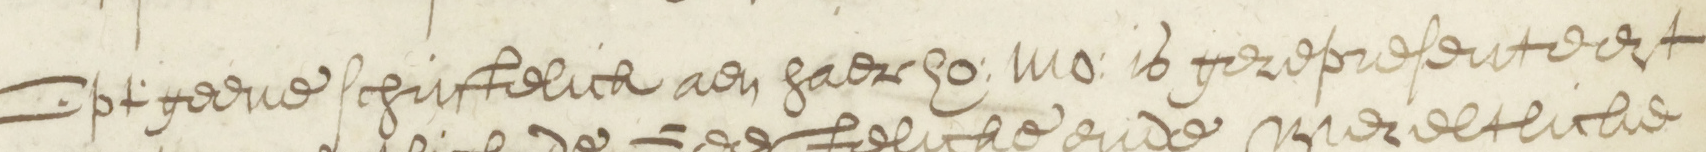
Opt' geene schriftelick aen haer ho:mo: is gerepresenteert
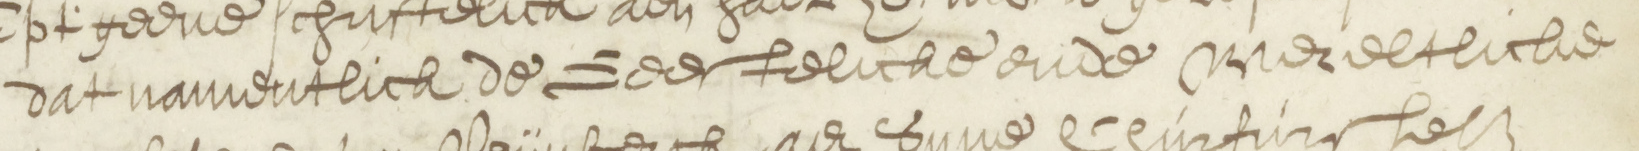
dat namentlick de Geestelicke ende wereltlicke
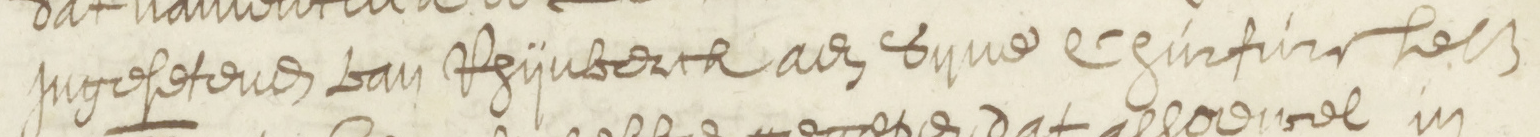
Ingesetenen van Rhijnberck aen Syne Churfursteln
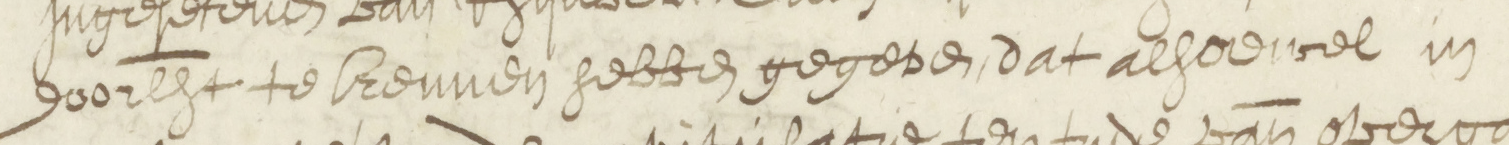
Doorlht te kennen hebben gegeven, dat alhoewel in
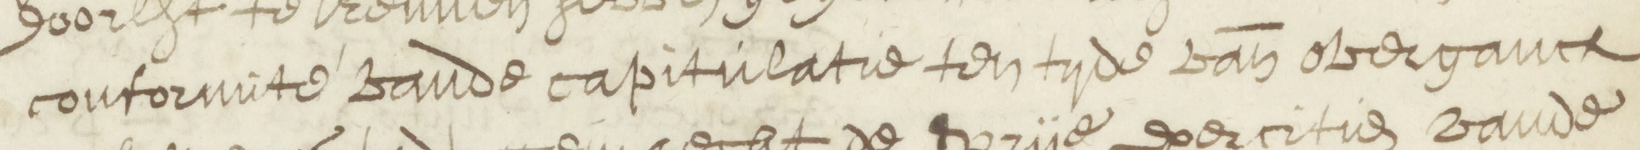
conformité vande capitulatie ten tijde van overganck
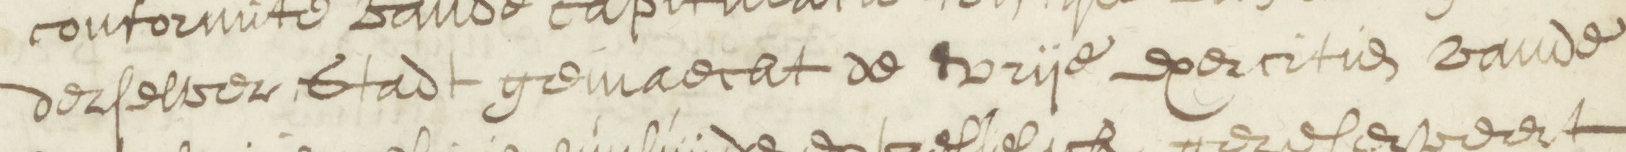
derselver Stadt gemaeckt de vrije exercitien vande
